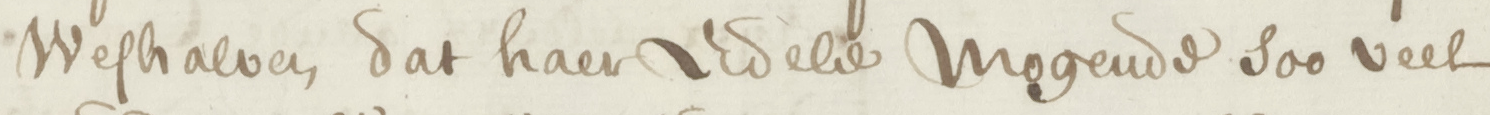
Weshalven dat haer Edele mogende soo veel
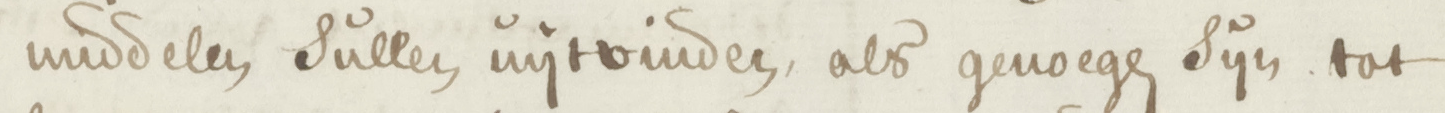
middelen sullen uijtvinden, als genoegh sijn, tot
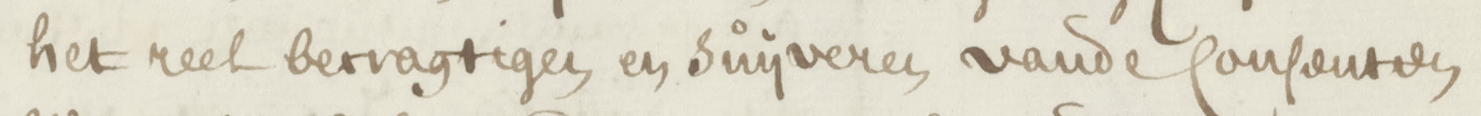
het reel becragtigen en suijveren vande consenten
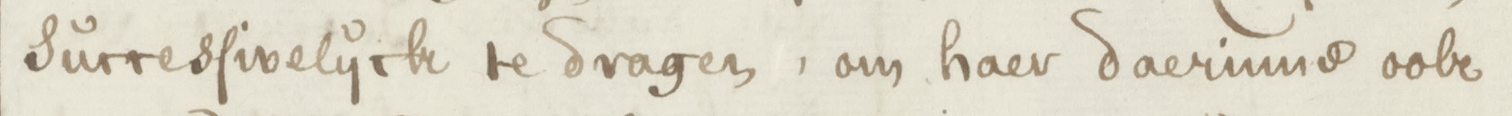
sucressivelijck te dragen, om haer daerinne ook
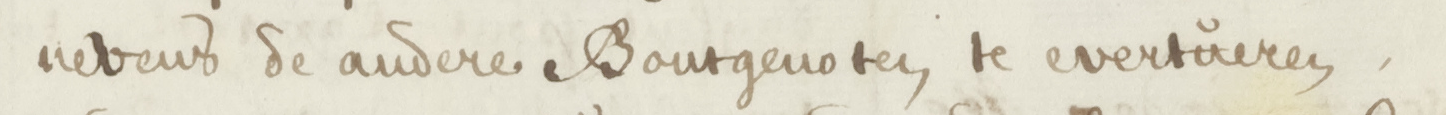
nevens de andere Bontgenoten te evertueren,
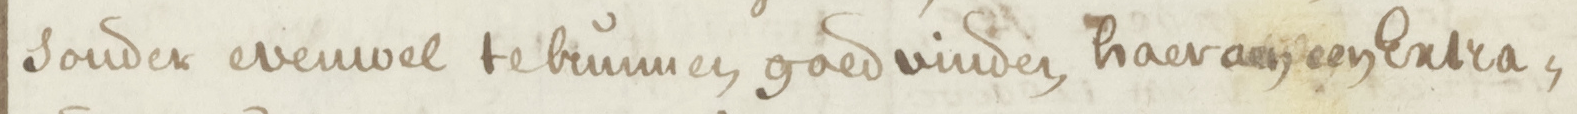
sonder evenwel te kunnen goedvinden haer aen een Extra,,
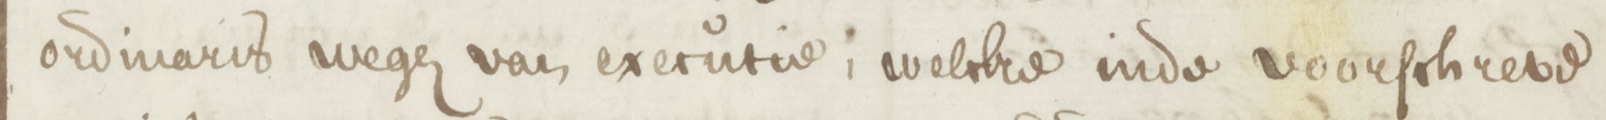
ordinaris wegh van executie, welcke inde voorschreve
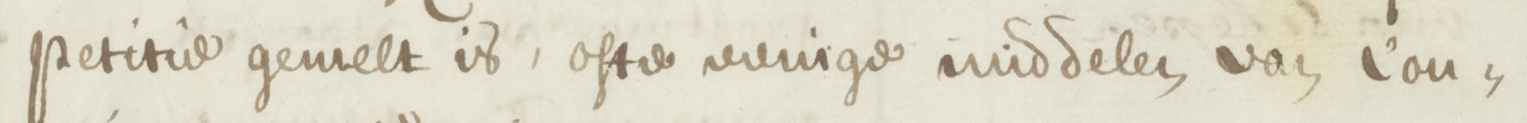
petitie gemelt is, ofte eenige middelen van Con„
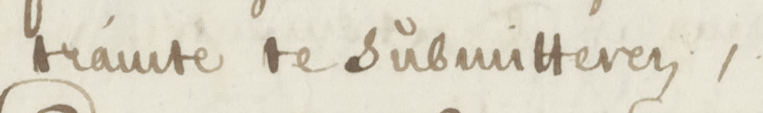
trainte te submitteren,
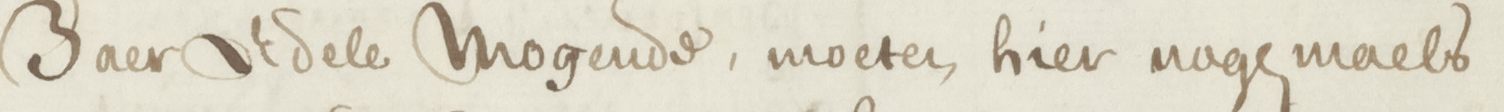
Haer Eidele Mogende, moeten hier noghmaels
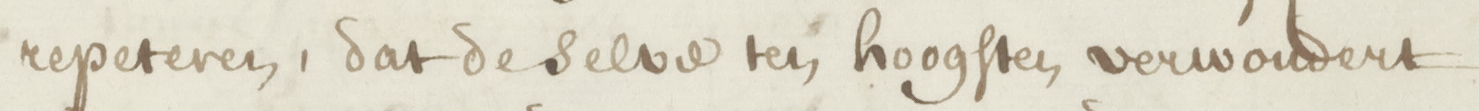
repeteren, dat deselve ten hoogsten verwondert
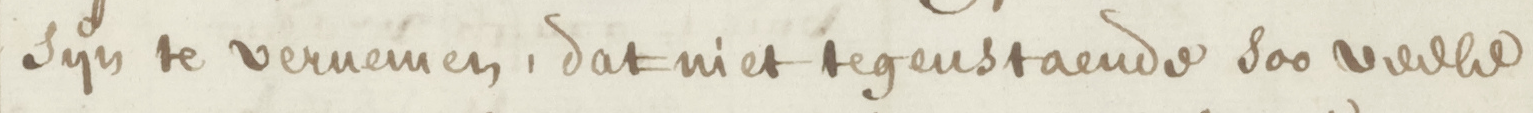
sijn te vernemen, dat niet tegenstaende soo veel
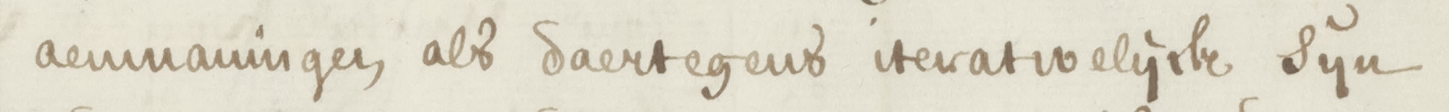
aenmaningen als daertegens iterativelijck sijn
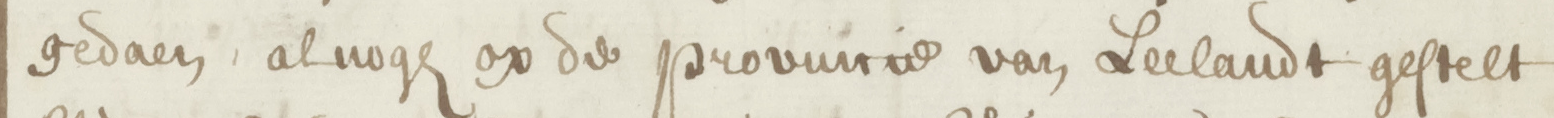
gedaen, alnogh op de provincie van Zeelandt gestelt
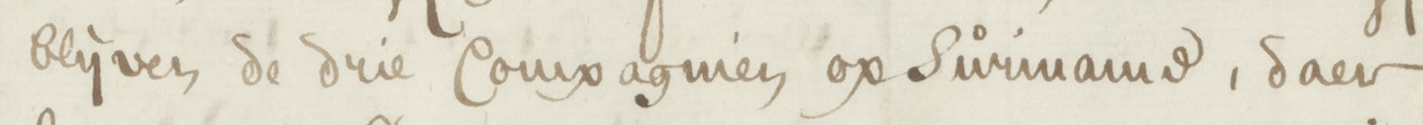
blijven de drie Compagnien op Suriname, daer
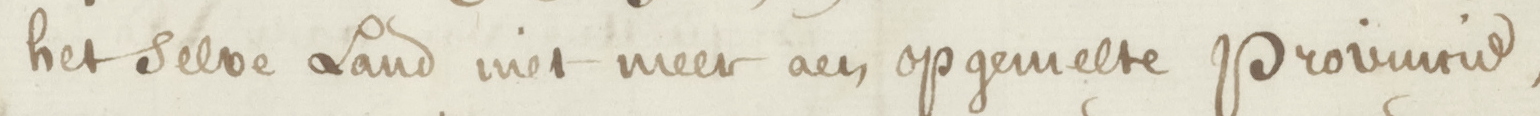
het selve Land niet meer aen opgemelte Provincie
